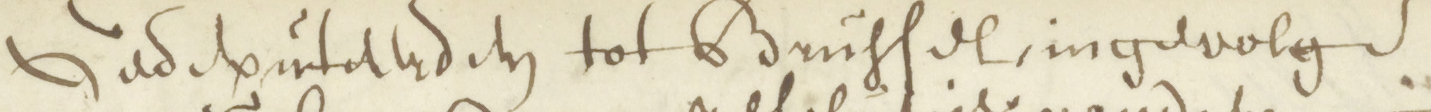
Gedeputeerden tot Brussel, ingevolge
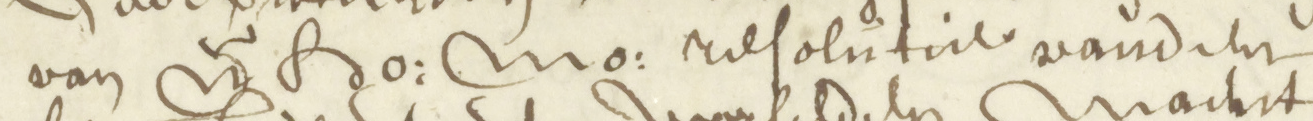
van U Ho:Mo: resolutie vanden
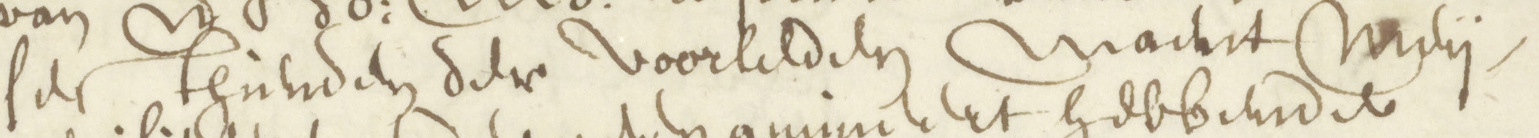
sesthienden der voorleden Maent Meij,
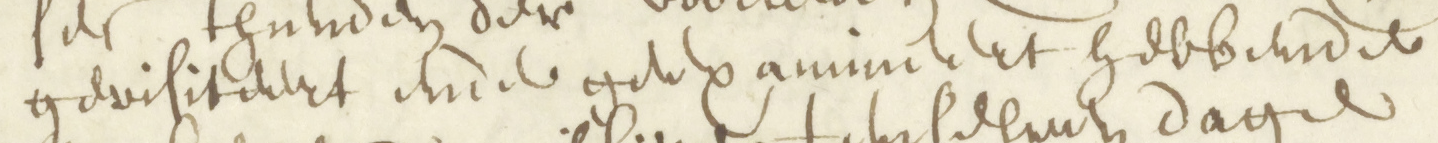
gevisiteert ende geexamineert hebbende
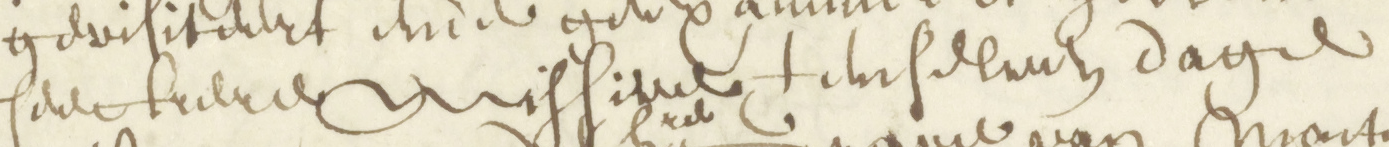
seeckere Missive tenselven dage
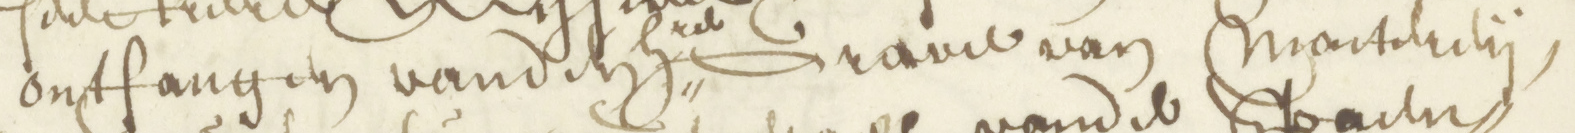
ontfangen vanden Hre Grave van Montereij,
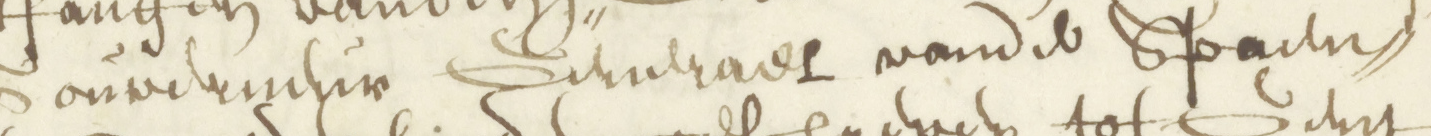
Gouverneur Generael vande Spaen„
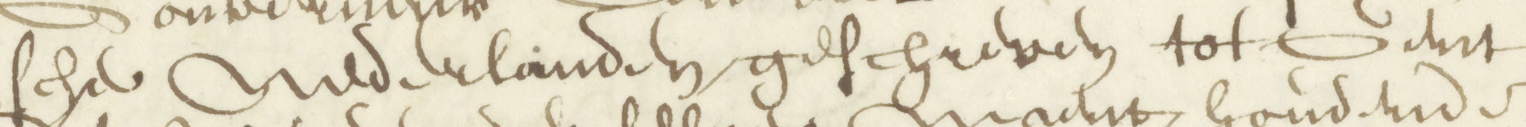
sche Nederlanden, geschreven tot Gent
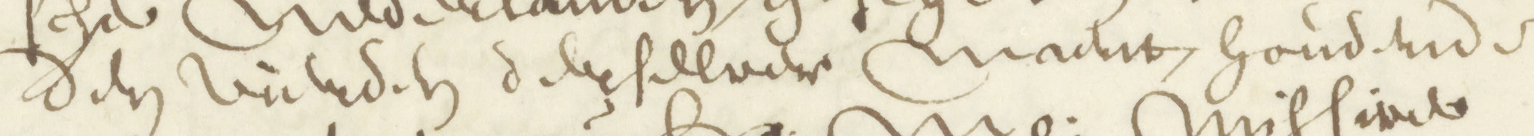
den vierden derselver Maent, houdende
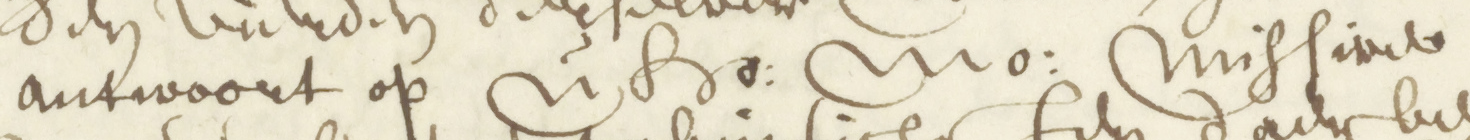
antwoort op U Ho:Mo: Missive
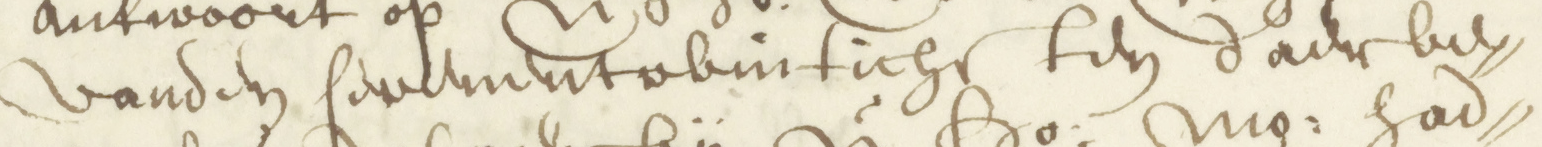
vanden sevenentwintichsten daer be„
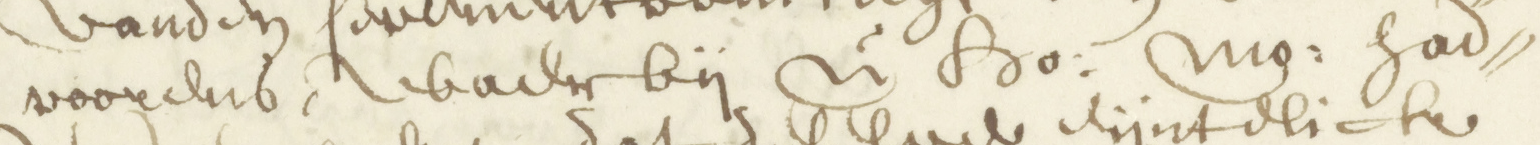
voorens, Waerbij U Ho:Mo: had„
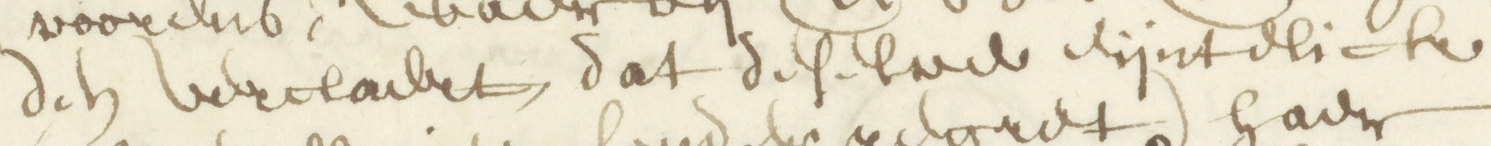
den verclaert, dat deselve eijntelick
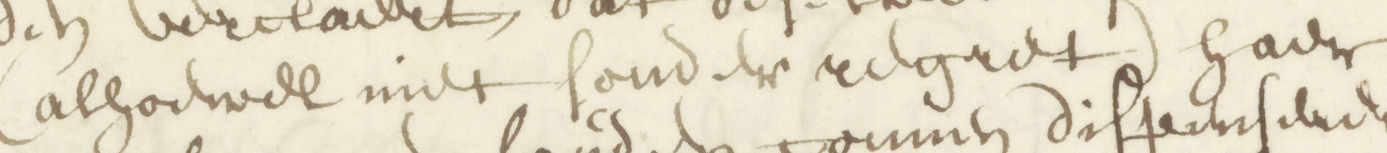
(alhoewel niet sonder regret) haer
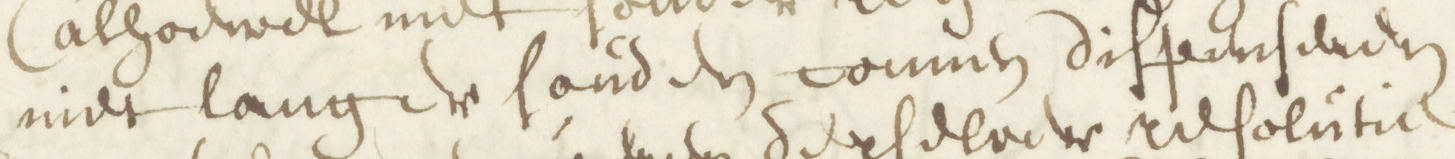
niet langer souden connen dispenseren
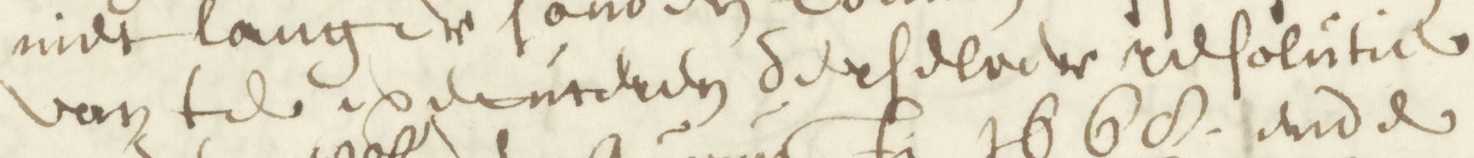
van te executeren derselver resolutie
